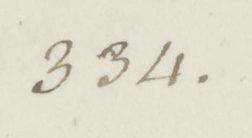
334.
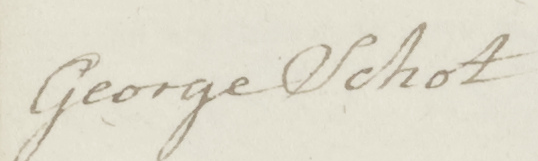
George Schot
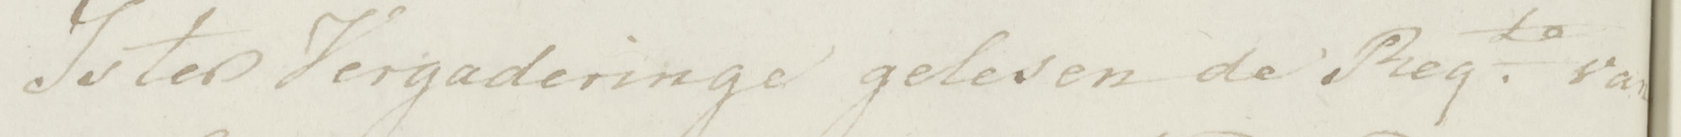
Is ter Vergaderinge gelesen de Req:te. van
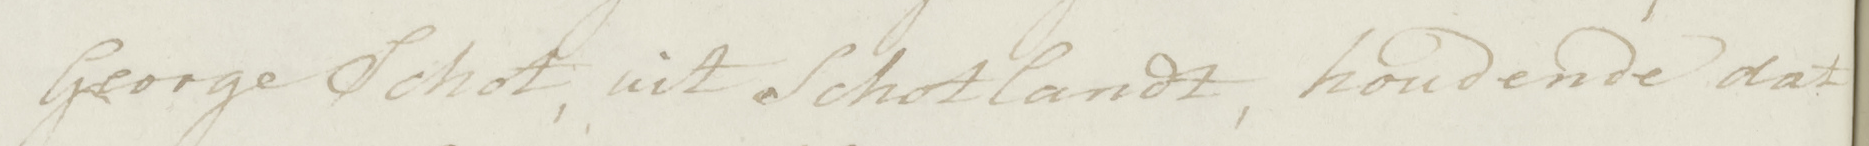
George Schot, uit Schotlandt, houdende dat
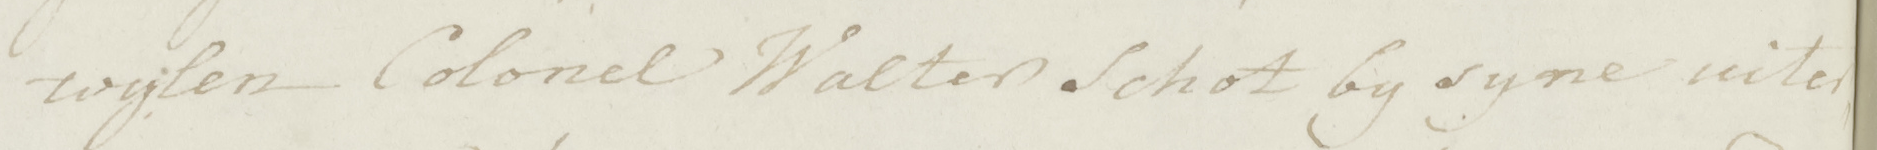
wijlen Colonel Walter Schot bij sijne uiter„
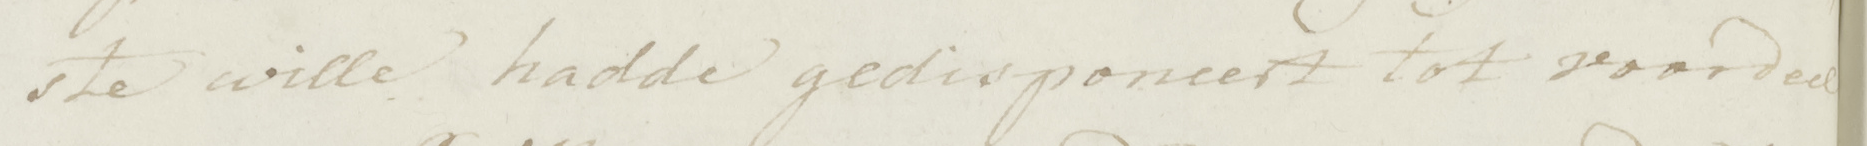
ste wille hadde gedisponeert tot voordeel
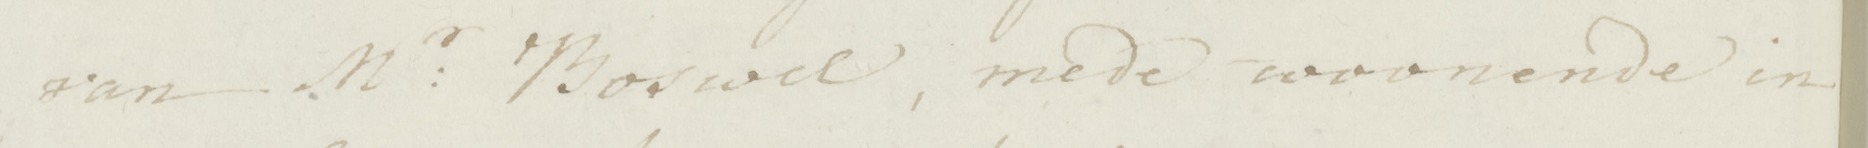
van Mr: Boswel; mede woonende in
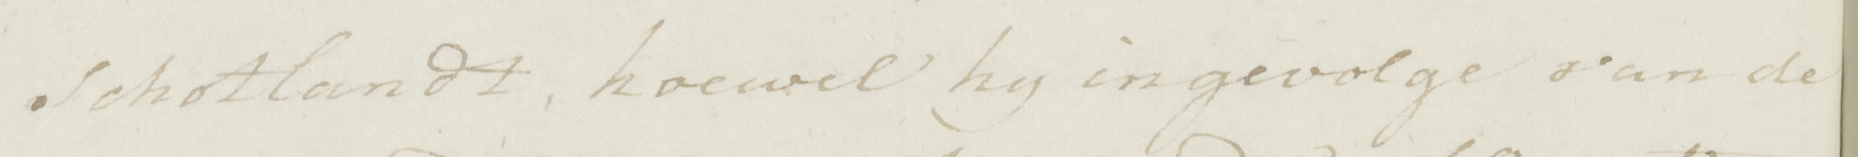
Schotlandt, hoewel hij ingevolge van den
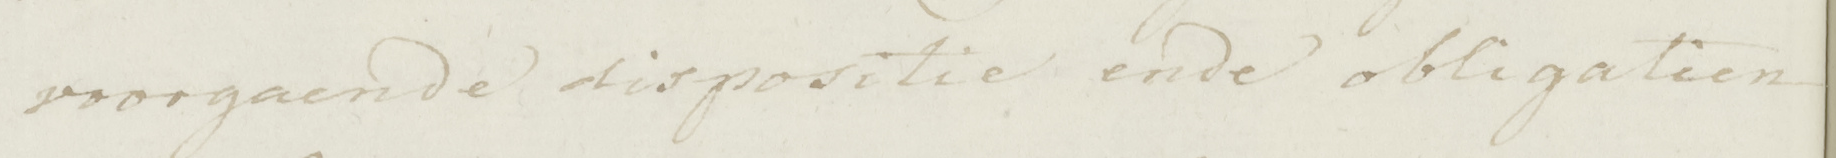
voorgaende dispositie ende obligatien
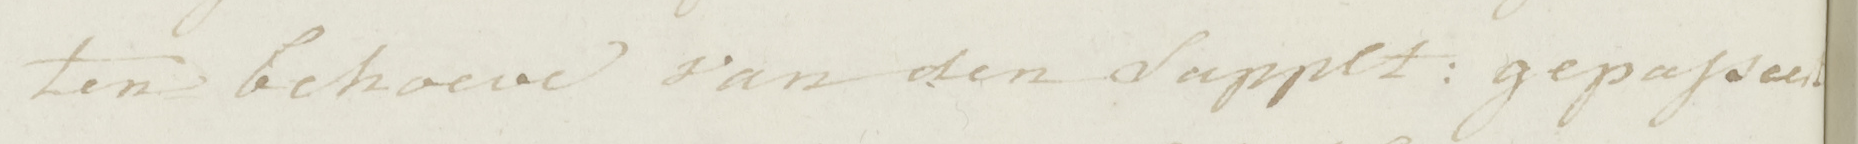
ten behoeve van den Supplt: gepasseert
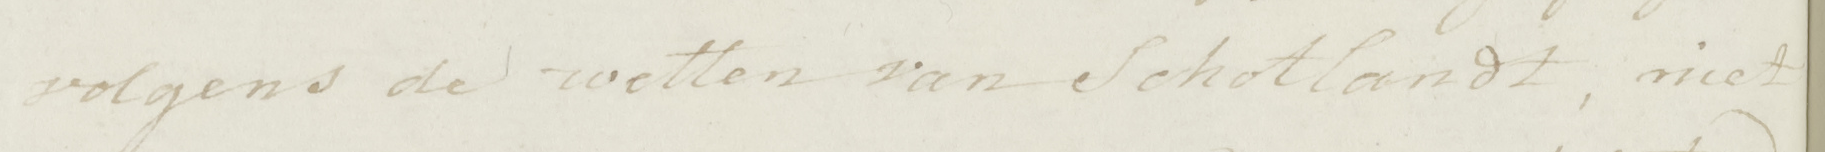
volgens de wetten van Schotlandt, niet
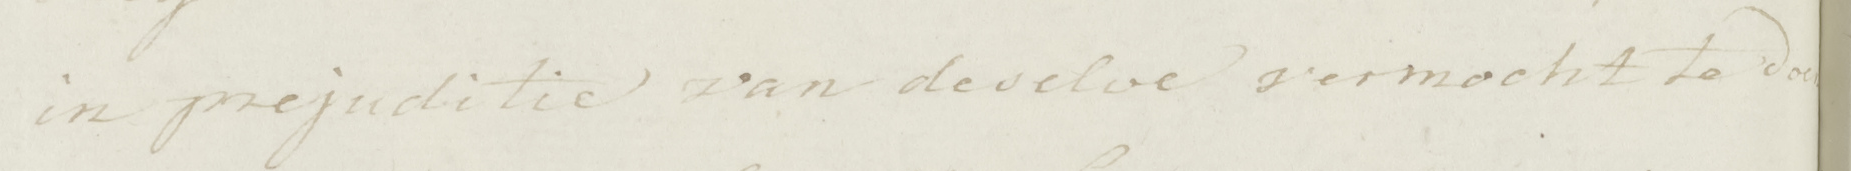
in prejuditie van deselve vermocht te doe
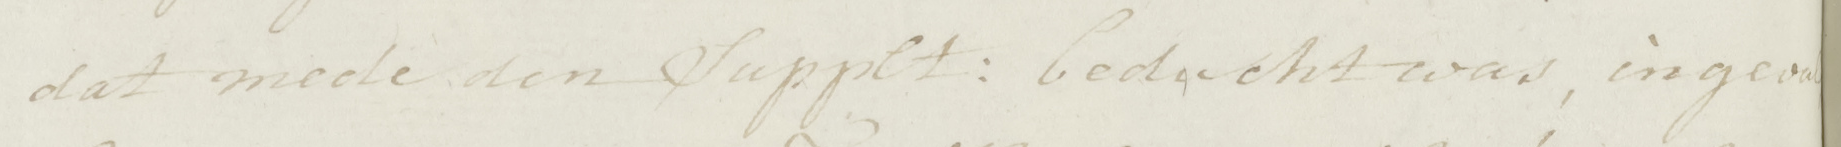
dat meede den Supplt: beducht was ingeval
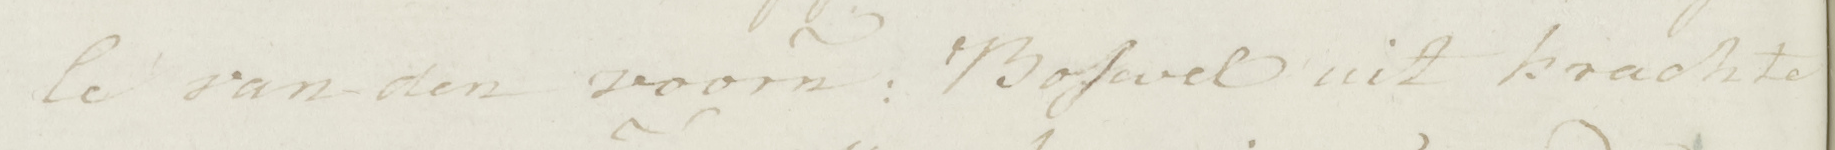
le van den voorn: Boswel uit krachte
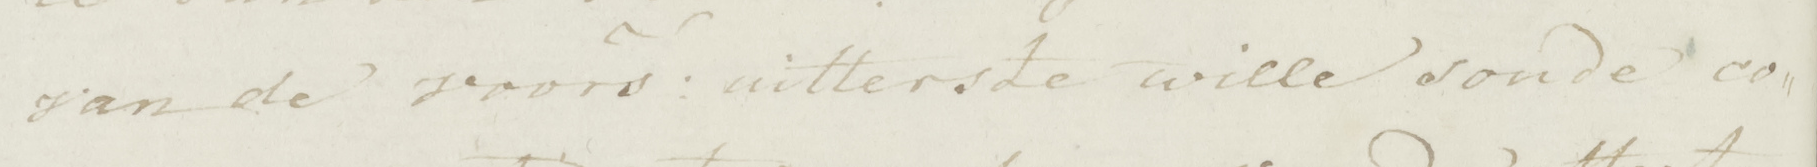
van de voors: uitterste wille soude co„
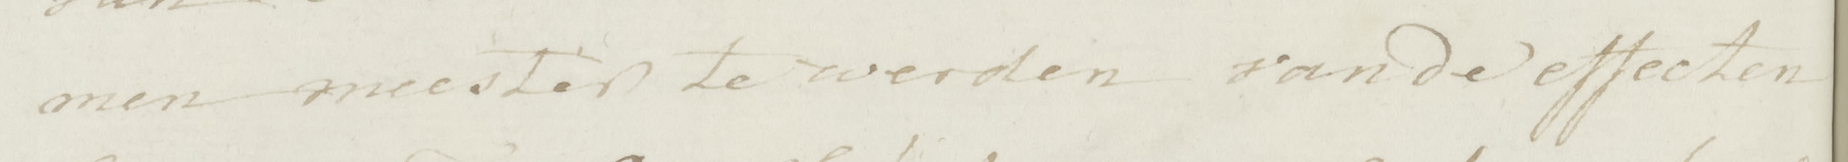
men meester te werden van de effecten
